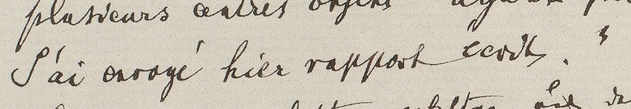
J'ai envoyé hier rapport écrit.»
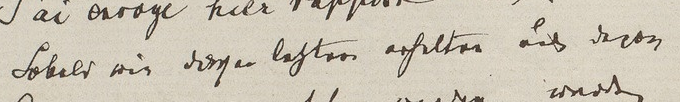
Sobald wir diesen letztern erhalten und davon
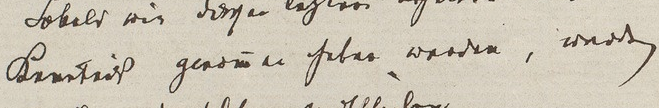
Kenntniß genommen haben werden, werde
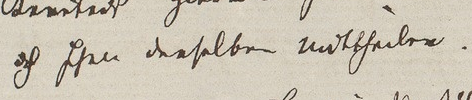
ich Ihnen denselben mittheilen.
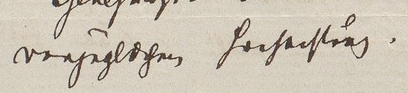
vorzüglichen Hochachtung
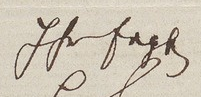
Ihr Ergbener
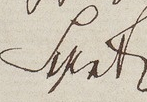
Schenk
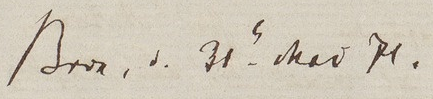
Bern, d. 31t Mai 71.
